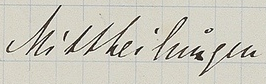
Mittheilungen
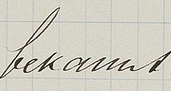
bekannt
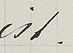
ist.
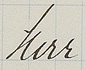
Herr
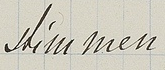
stimmen nicht
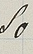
so
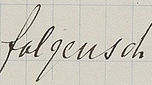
folgenschwerer
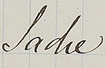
Sache
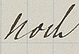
bean-
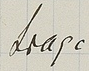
trage ich
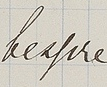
Bespre-
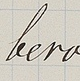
chung
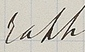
bevor
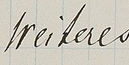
geschieht.»
